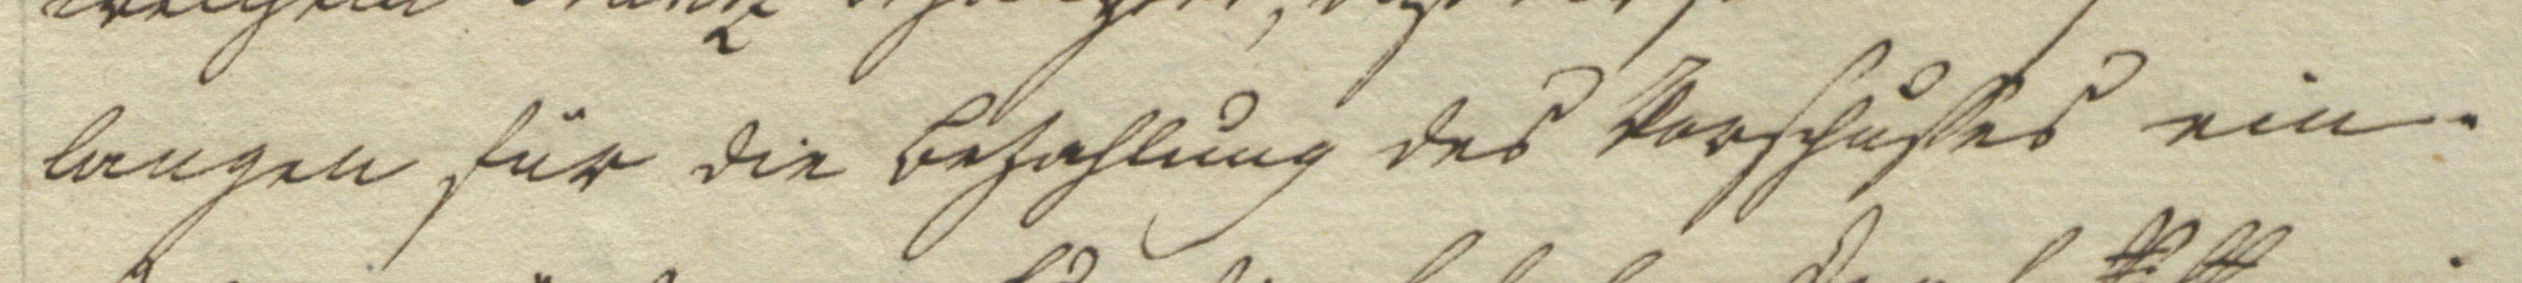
langen für die Bezahlung des Vorschusses ein¬
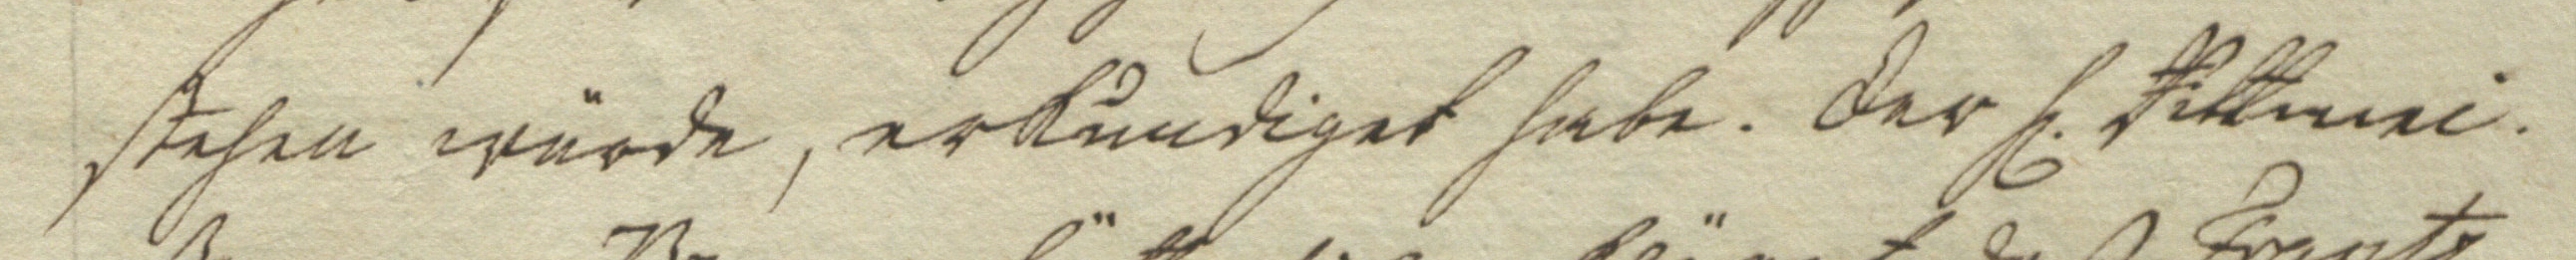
stehen würde, erkundiget habe. Der h. Rittmei¬
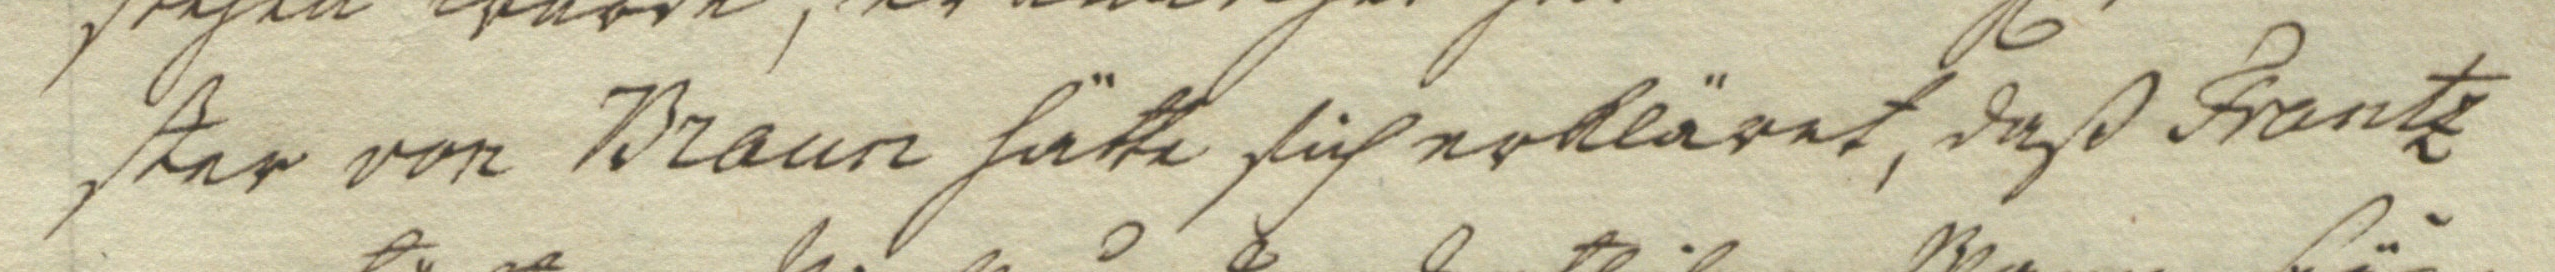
ster von Braun hätte sich erkläret, daß Frantz
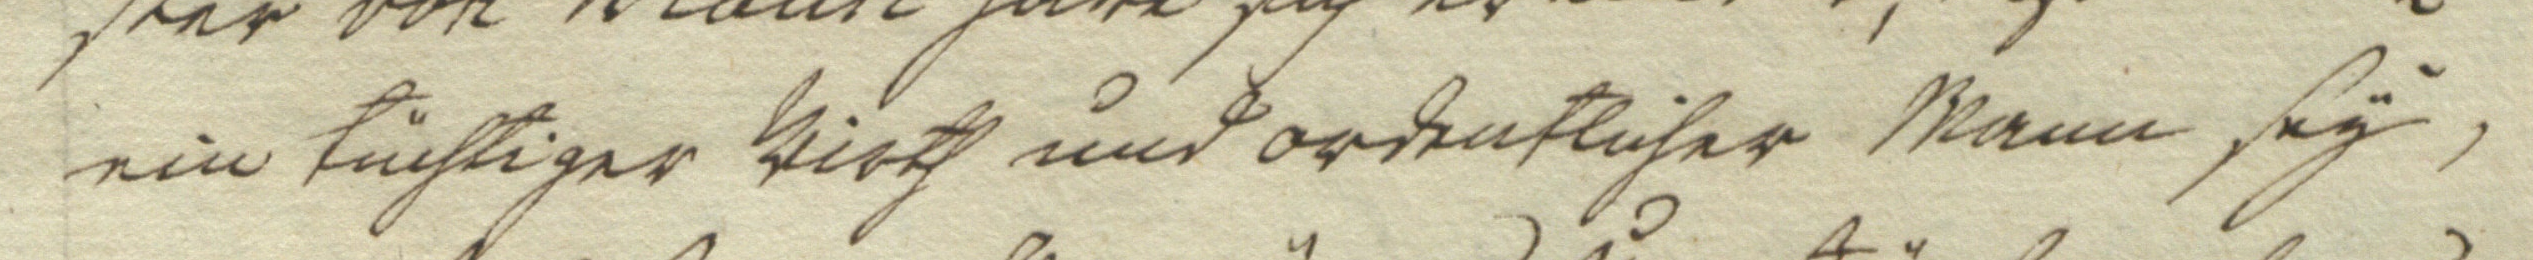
ein tüchtiger Wirth und ordentlicher Mann seÿ,
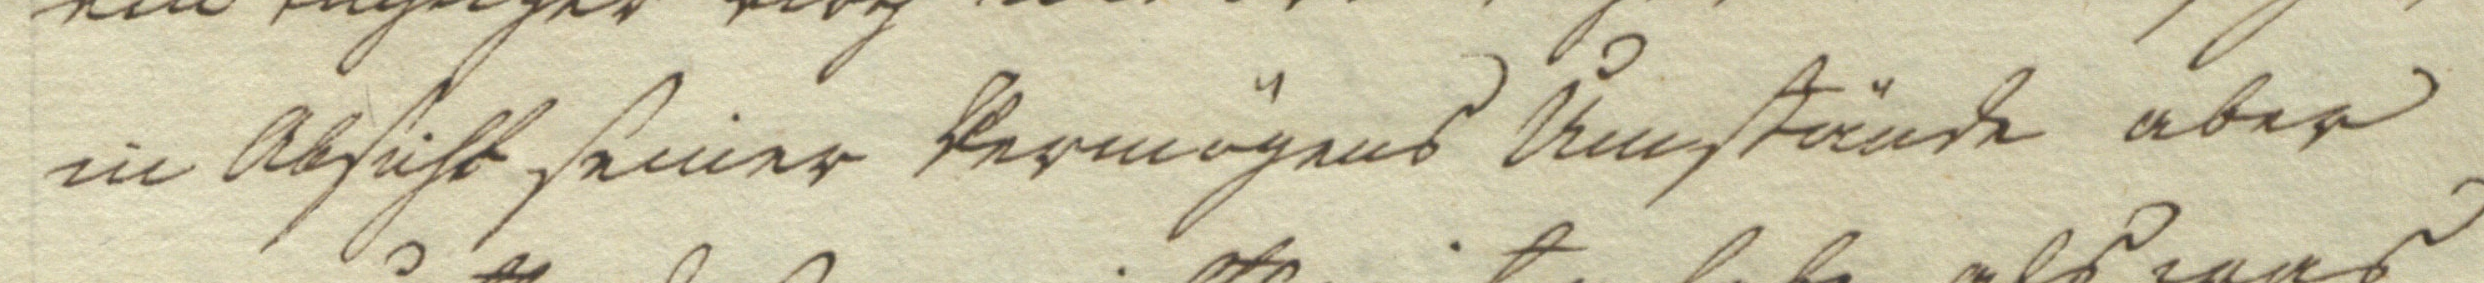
in Absicht seiner Vermögens Umstände aber
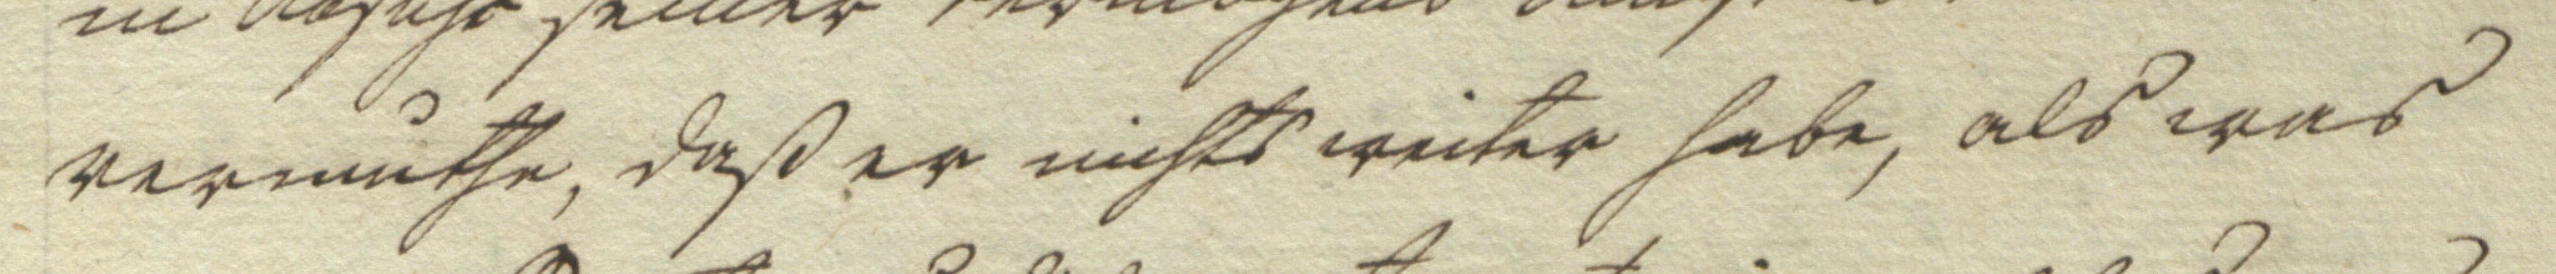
vermuthe, daß er nichts weiter habe, als was
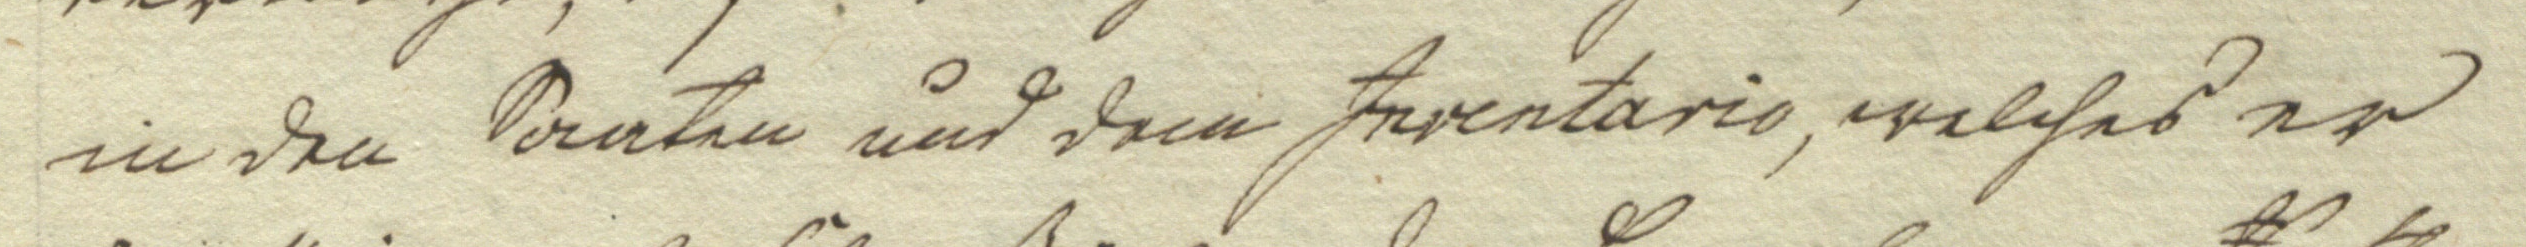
in den Saaten und dem Inventario, welches er
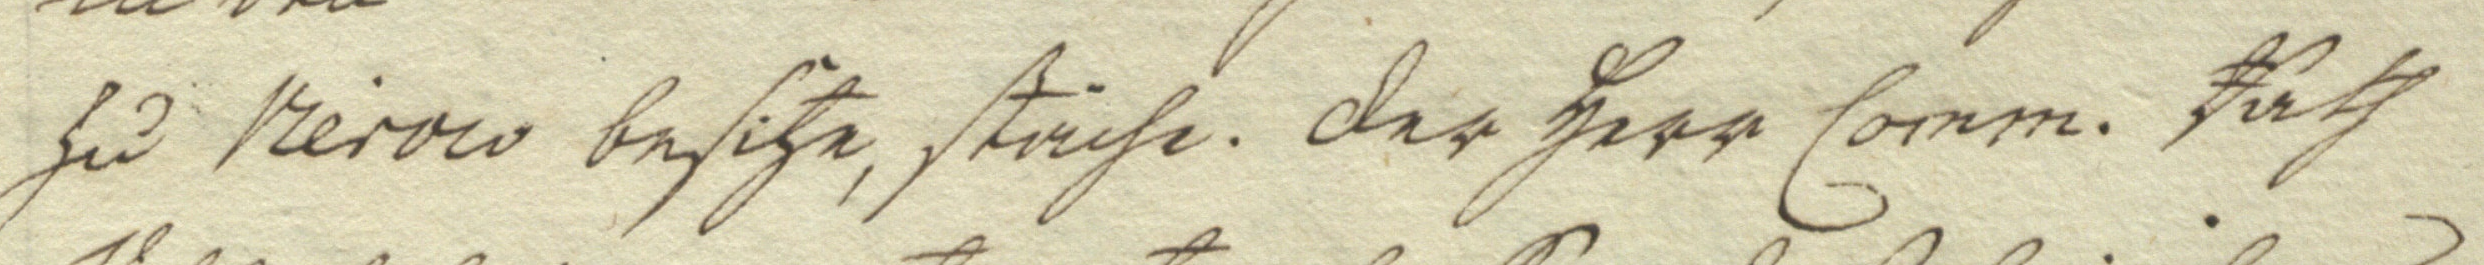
zu Vierow besitze, stäche. Der Herr Comm. Rath
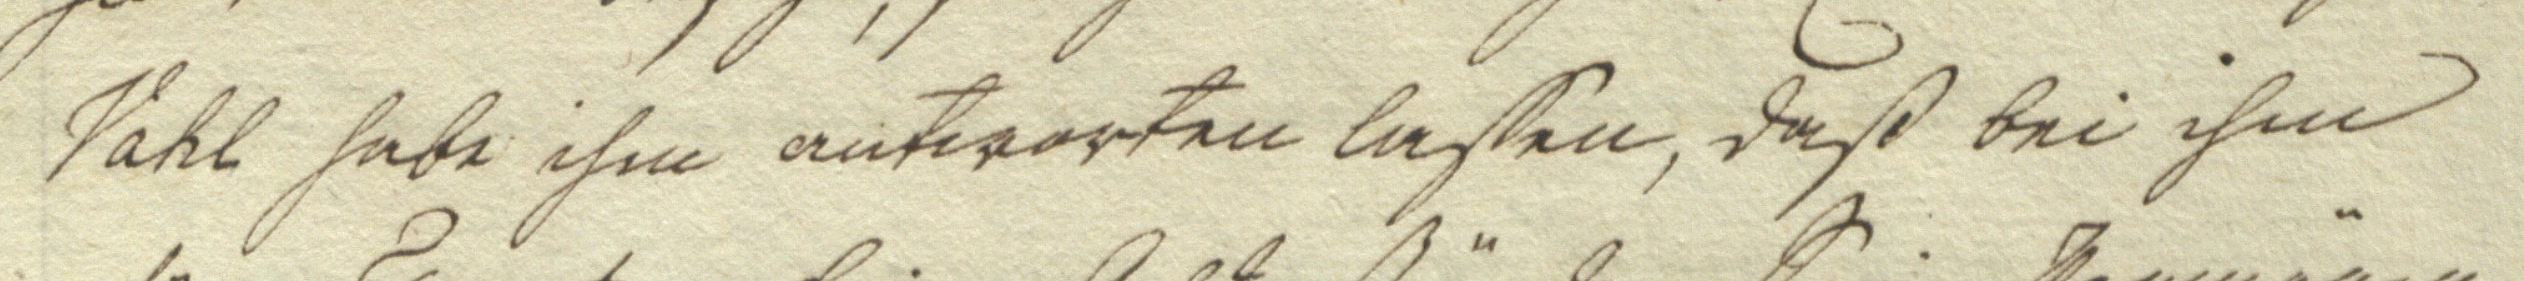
Vahl habe ihm antworten lassen, daß bei ihm
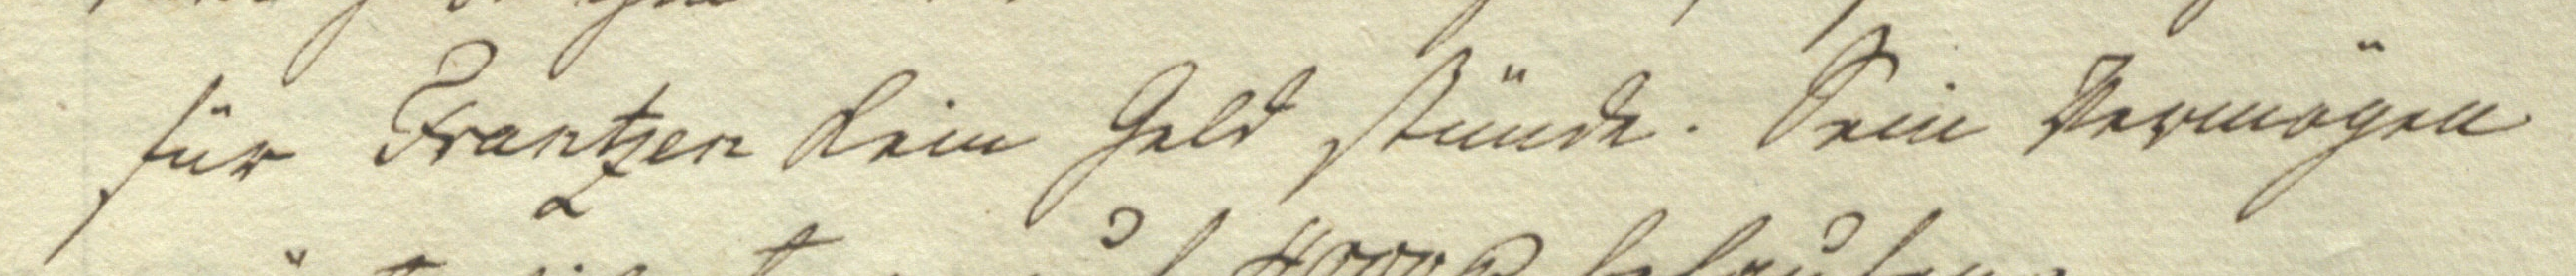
für Frantzen kein Geld stünde. Sein Vermögen
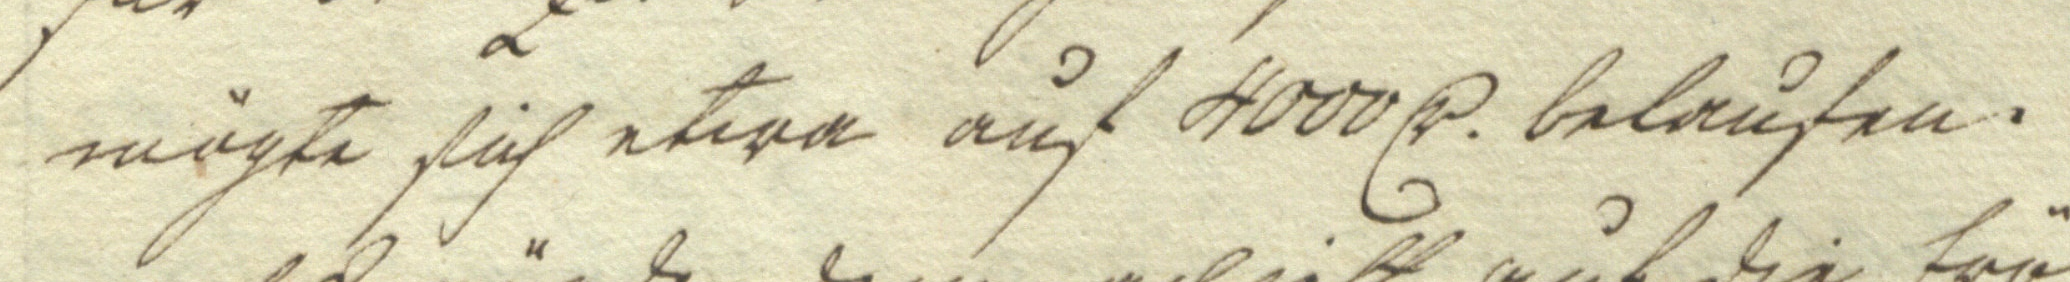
mögte sich etwa auf 4000 l. belaufen.
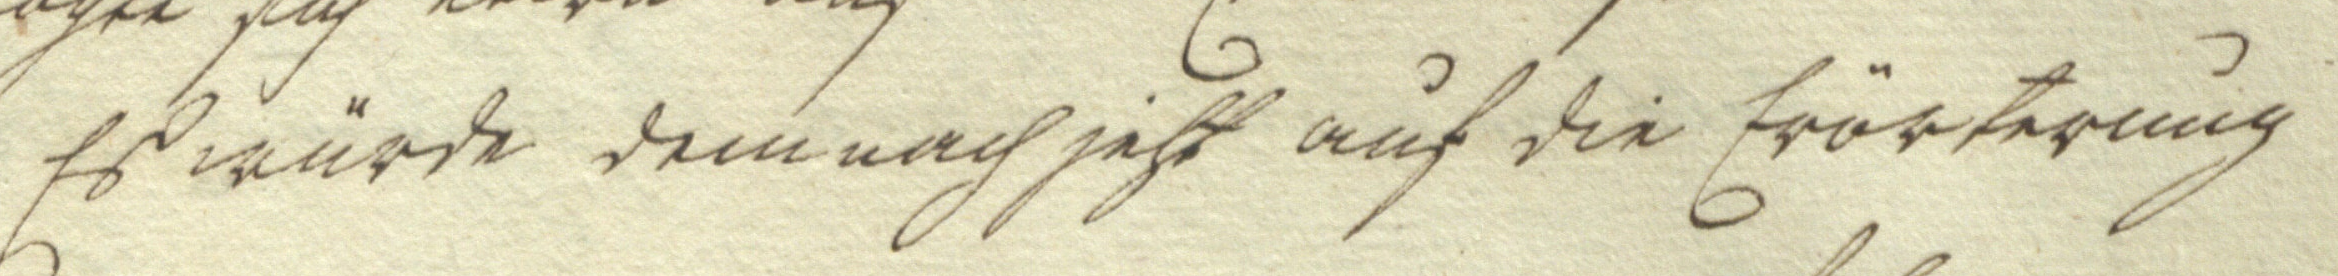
Es würde demnach jetzt auf die Erörterung
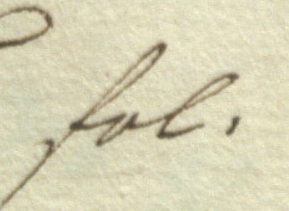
fol
